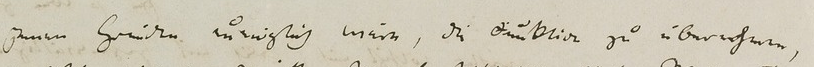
jenen Gründen unmöglich wäre, die Funktion zu übernehmen,
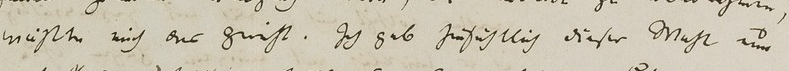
wählte mich das Gericht. Ich gab hinsichtlich dieser Wahl nun
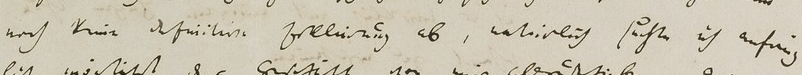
noch keine definitive Erklärung ab, natürlich suchte ich anfäng-
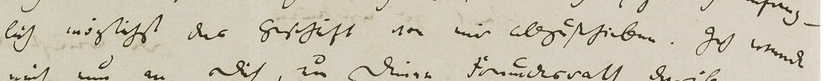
lich möglichst das Geschäft von mir abzuschieben. Ich wende
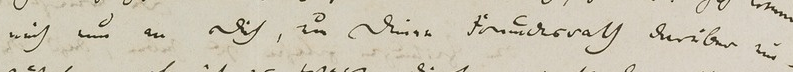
mich nun an Dich, um Deinen Freundesrath darüber ein-
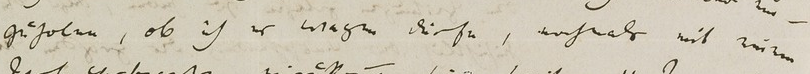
zuholen, ob ich es wagen dürfe, nochmals mit einem
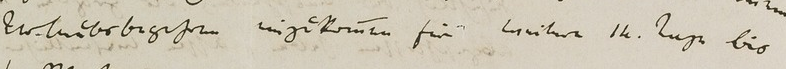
Urlaubsbegehren einzukommen für weitere 14. Tage bis
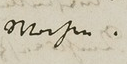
Wochen.
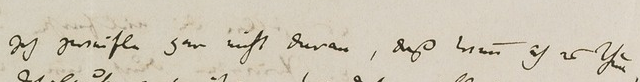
Ich zweifle gar nicht daran, daß wenn ich es thue,
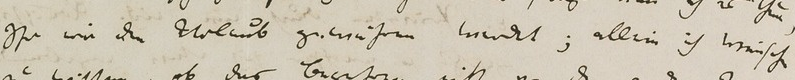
Ihr mir den Urlaub gewähren werdet; allein ich wünsche
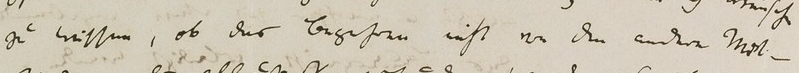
zu wissen, ob das Begehren nicht von den andern Mit-
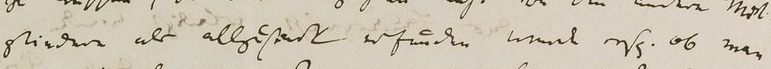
gliedern als allzustark erfunden werde resp. ob man
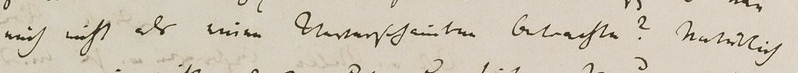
mich nicht als einen Unverschämten betrachte? Natürlich
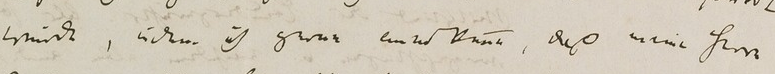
würde, indem ich gerne anerkenne, daß meine Herrn
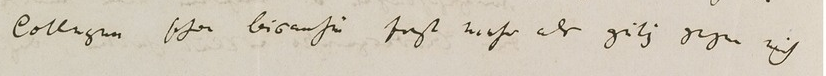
Collegen schon bis anhin fast mehr als gütig gegen mich
